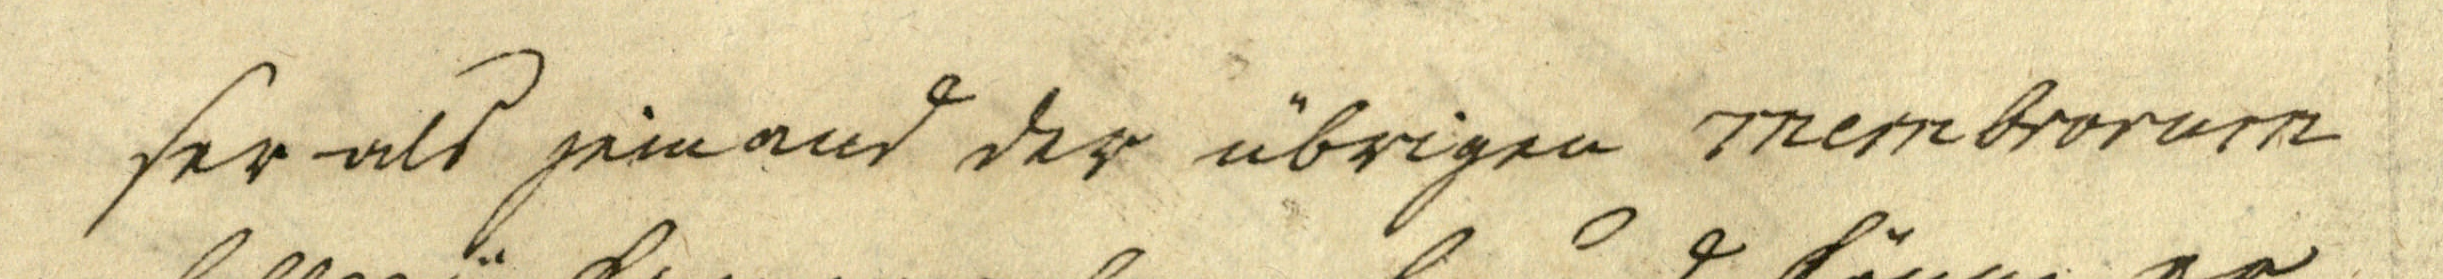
er als jemand der übrigen membrorum
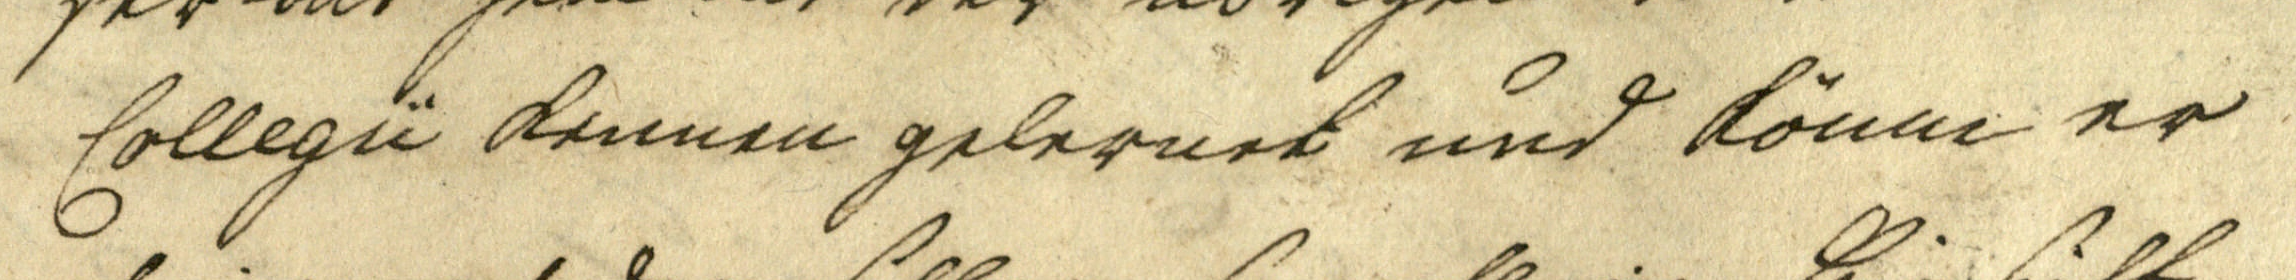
Collegii kennen gelernet und könne er
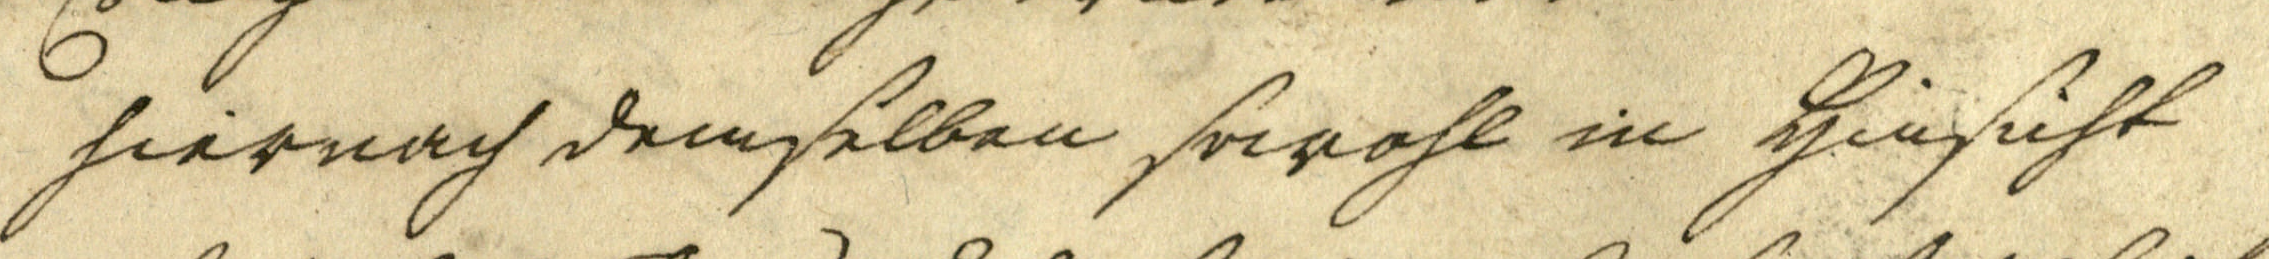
hiernach demselben sowohl in Hinsicht
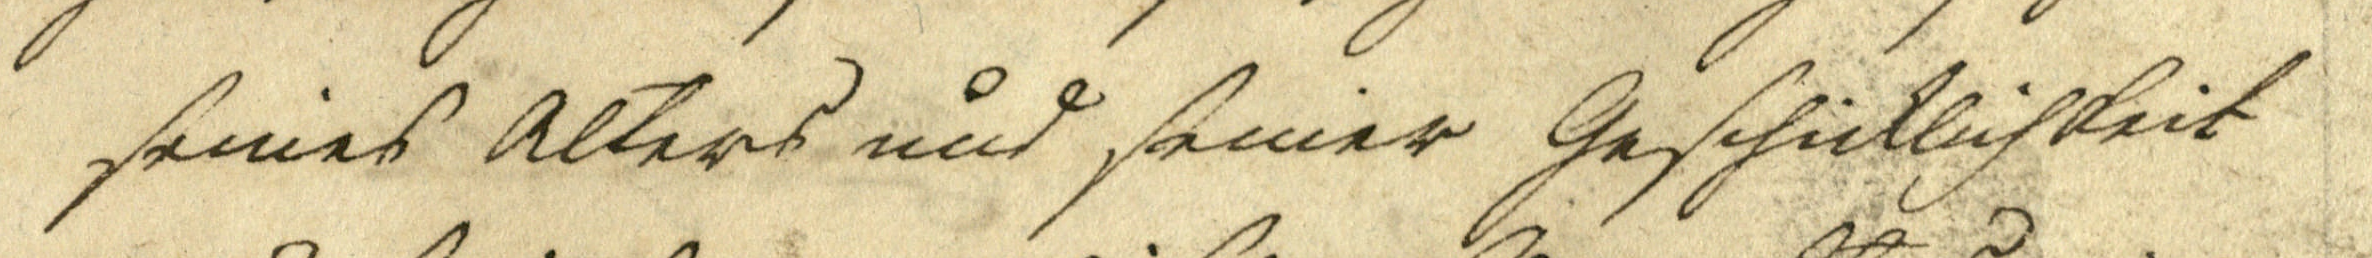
seines Alters und seiner Geschicklichkeit
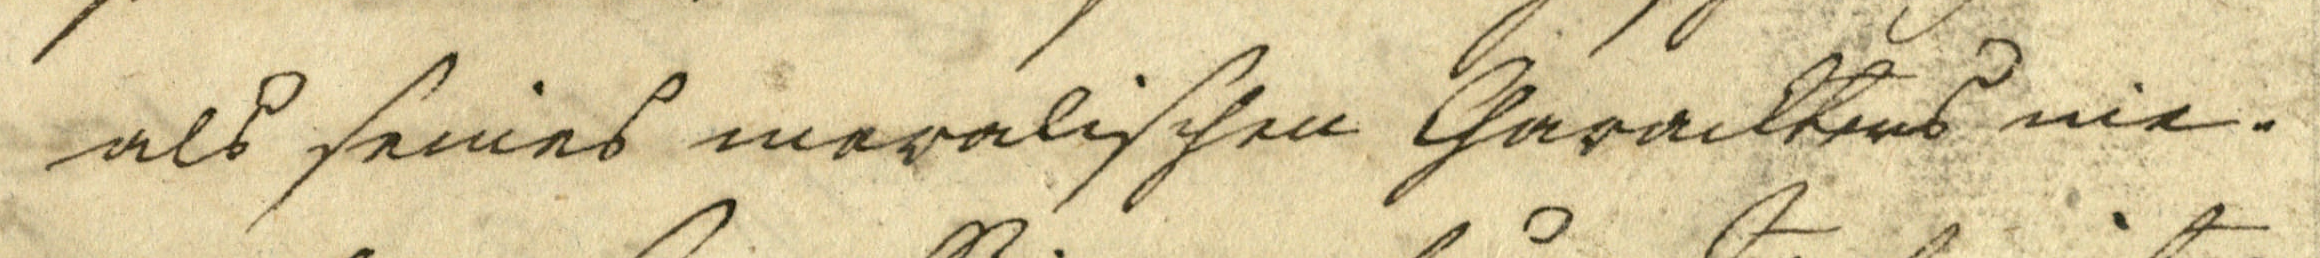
als seines meralischen Charackters nie¬
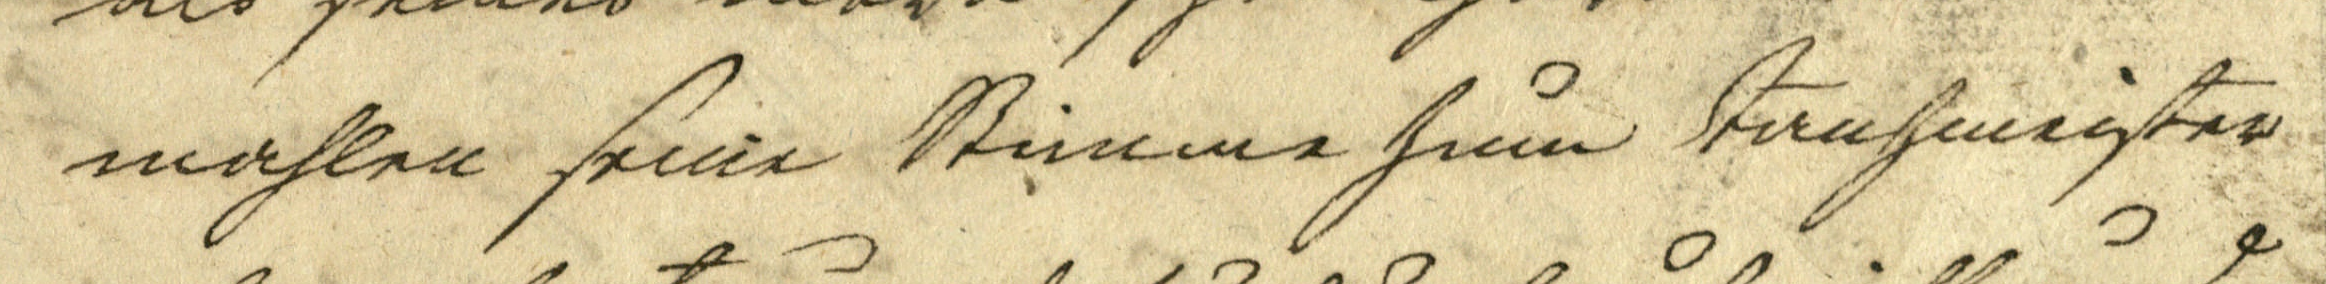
mahlen seine Stimme zum Tanzmeister
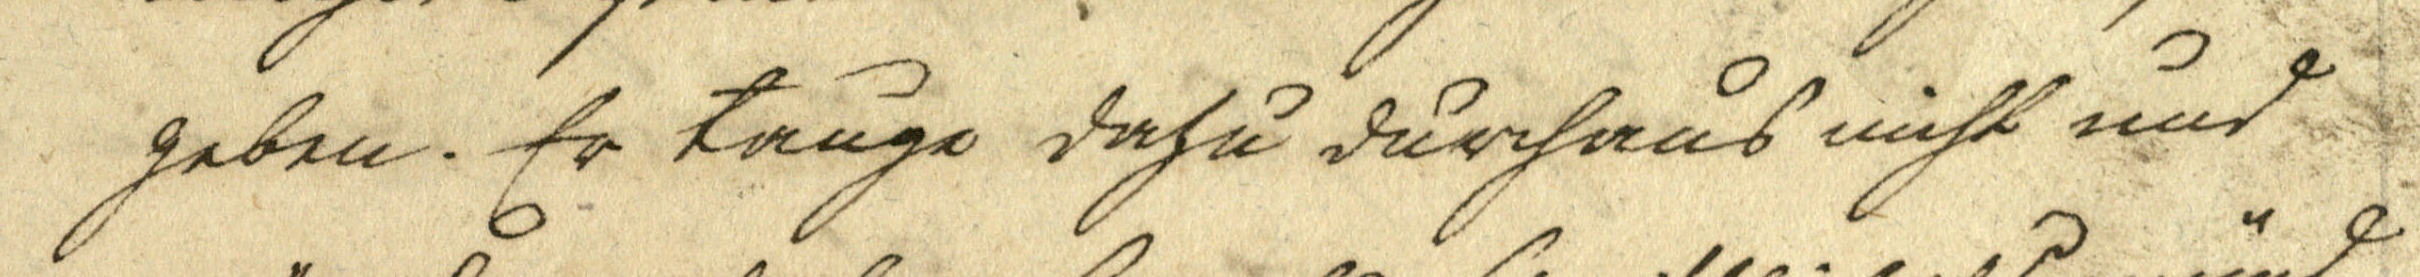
geben. Er tauge dazu durchaus nicht und
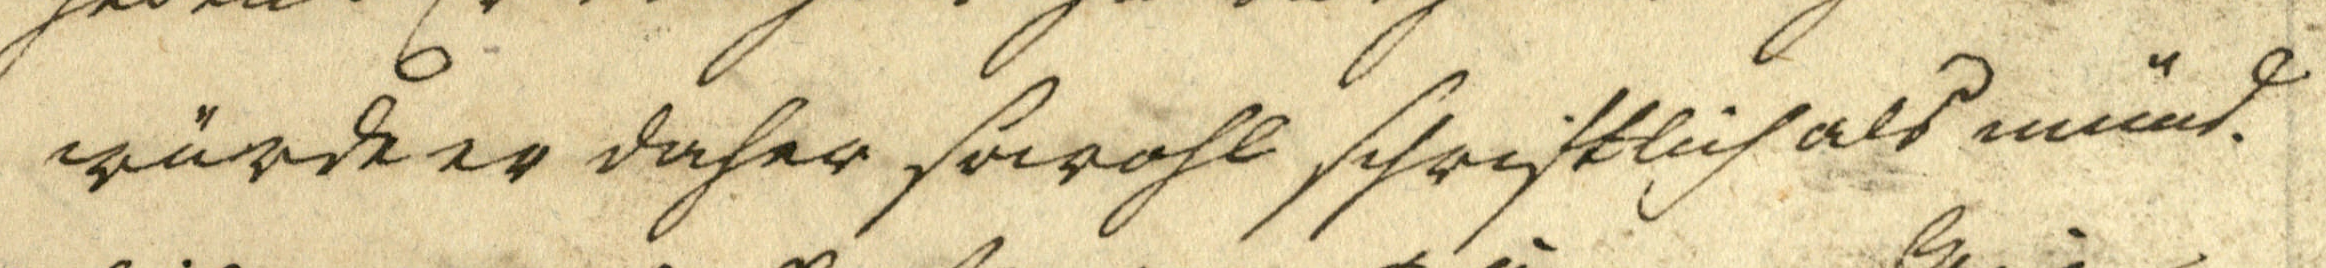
würde er daher sowohl schriftlich als münd¬
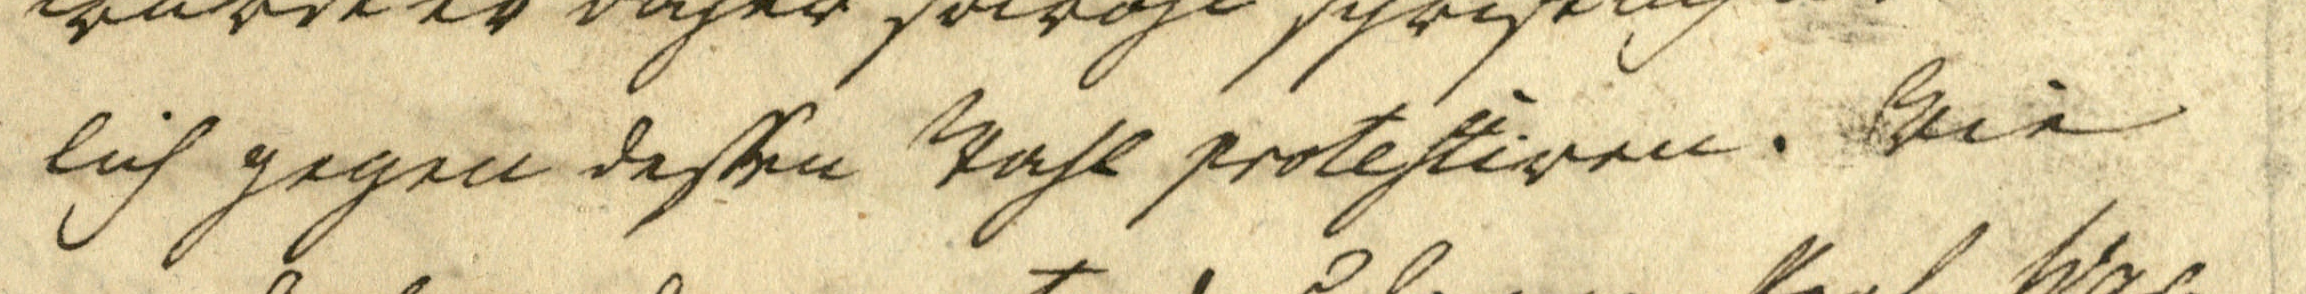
lich gegen dessen Wahl protestiren. Wie
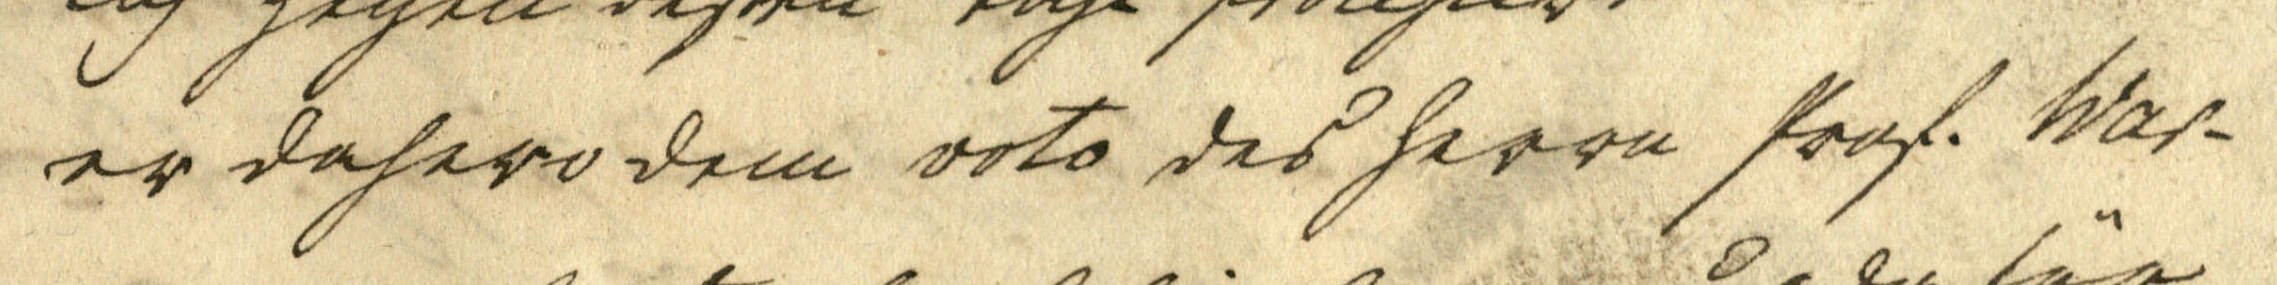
er daher dem voto des Herrn Prof. War¬
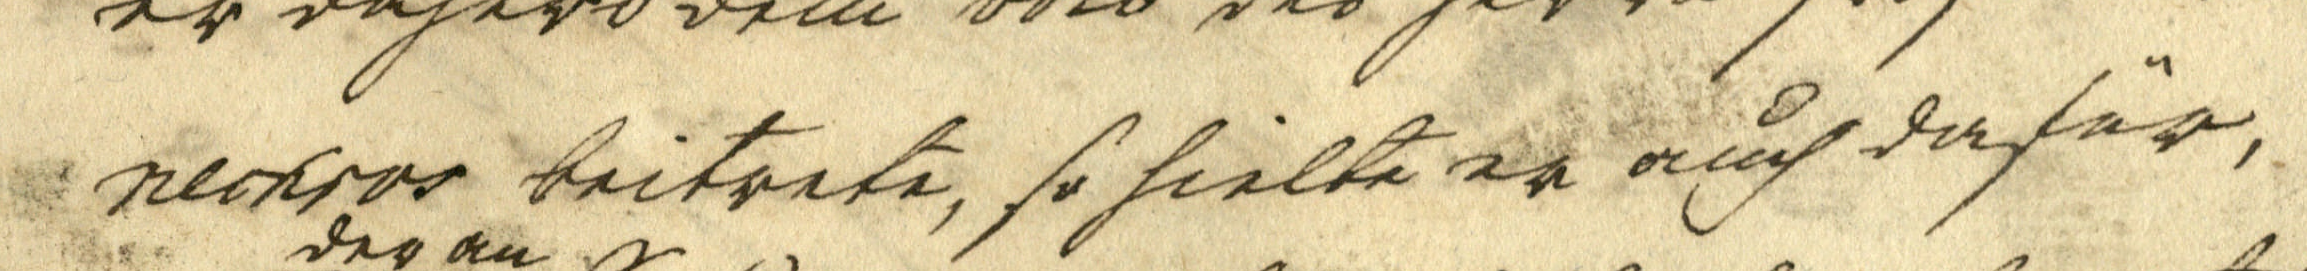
neckros beitrete, so hielte er auch dafür,
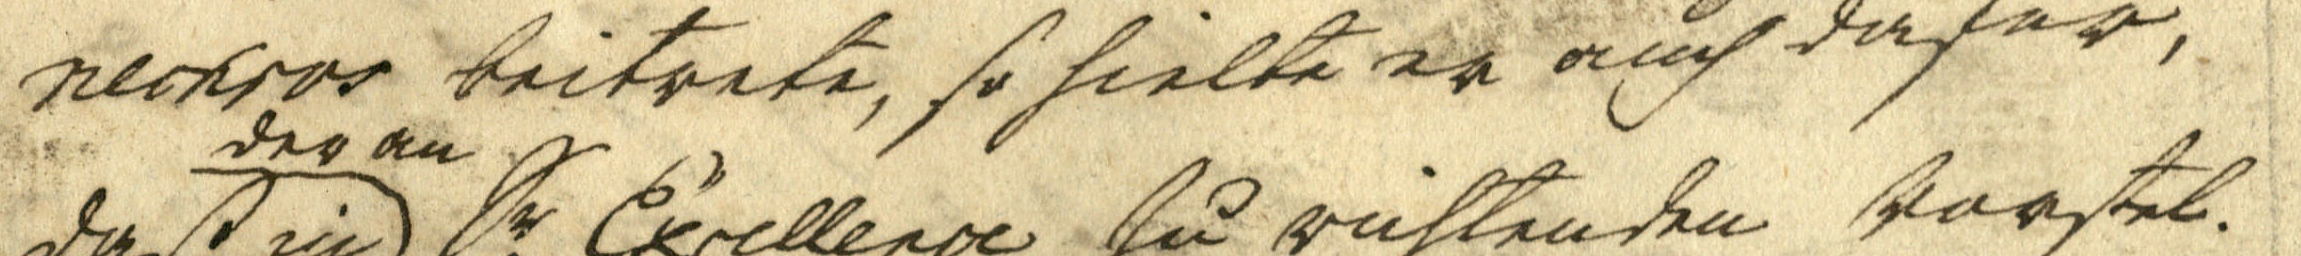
der an
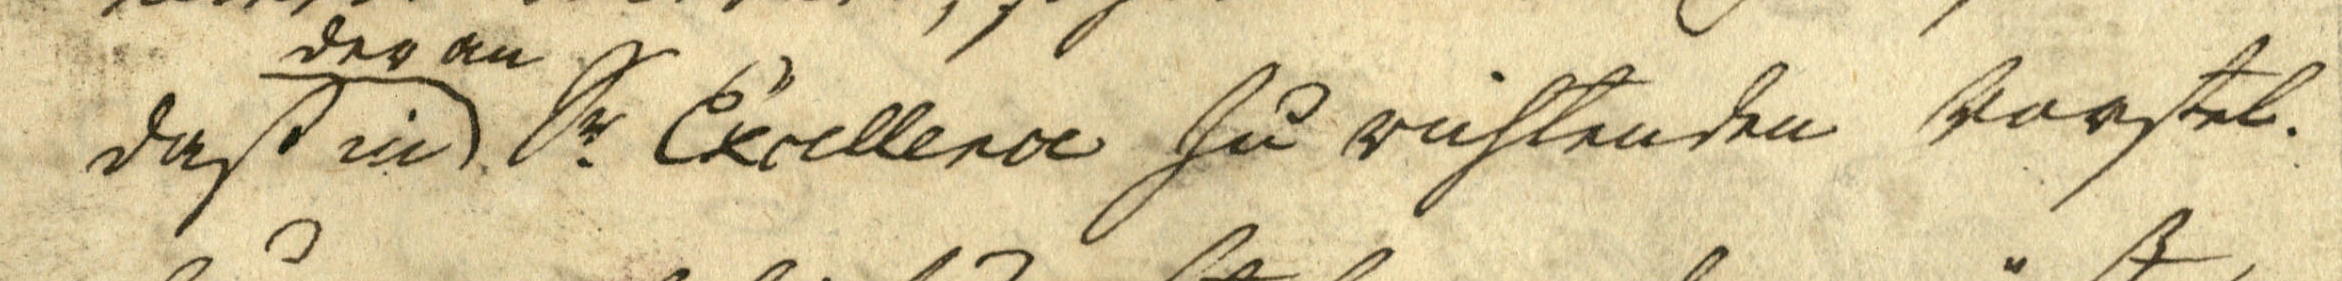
daß in Sr Excellence zu richtenden Vorstel¬
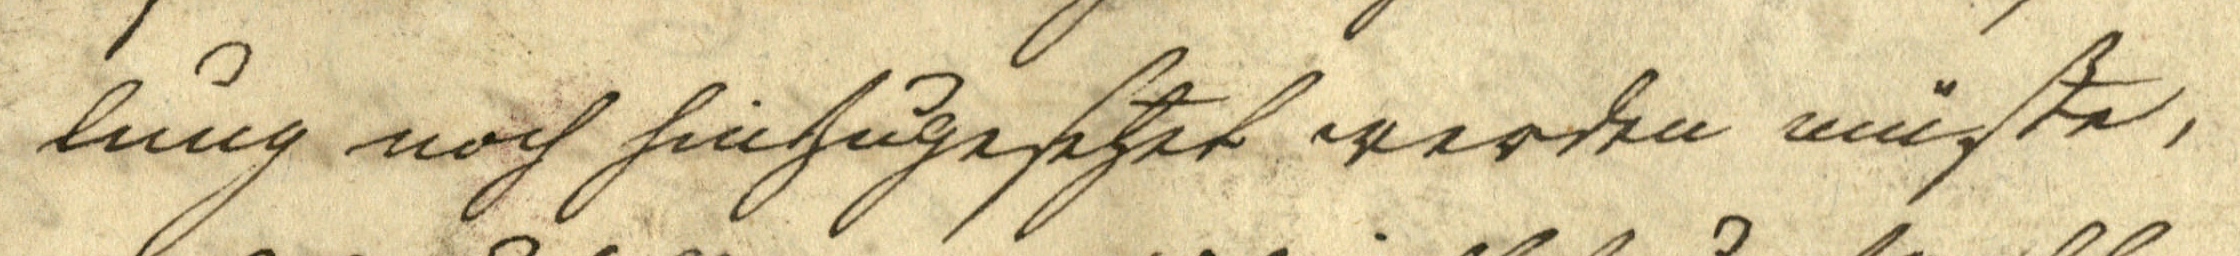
lung noch hinzugesetzt werden müßte,
